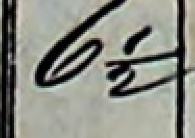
6 1/2
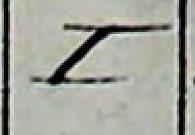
I
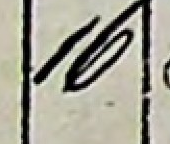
16
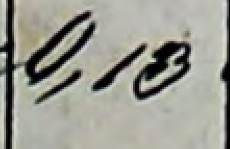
0,13
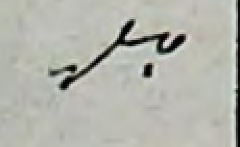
do
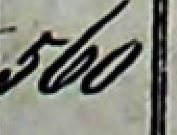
560
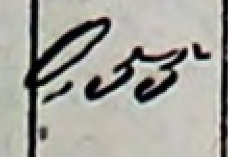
0,55
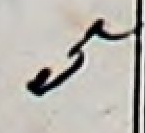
5
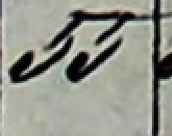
55
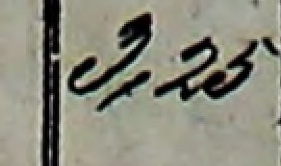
3,25
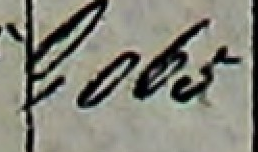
0,065
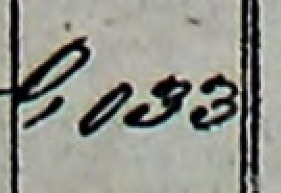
0,033
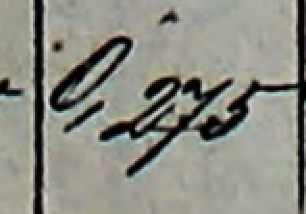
0,275
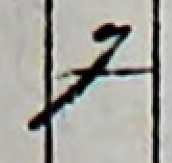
7
